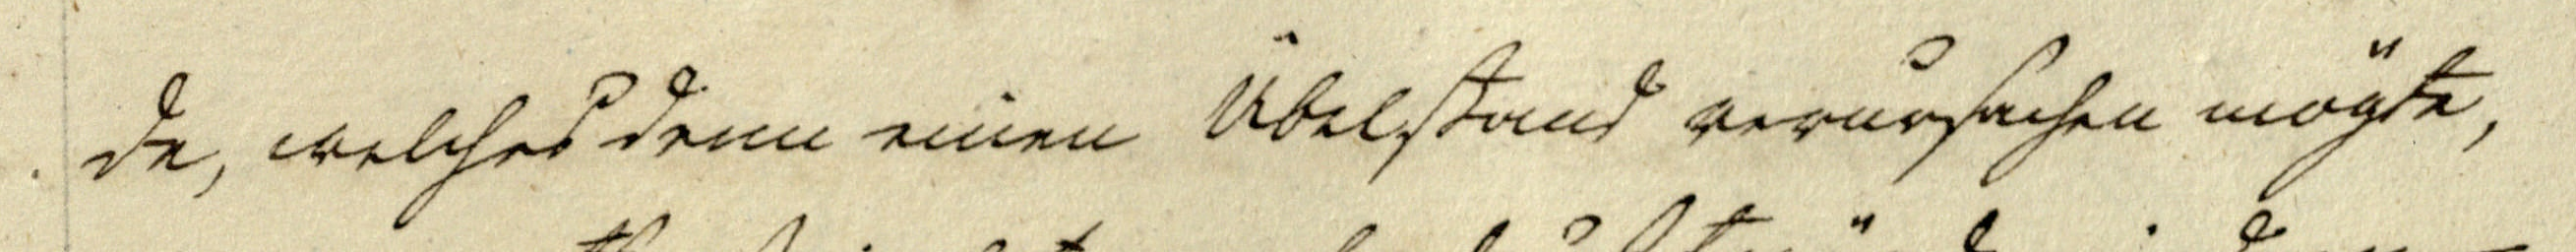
de, welches denn einen Übelstand verursachen mögte,
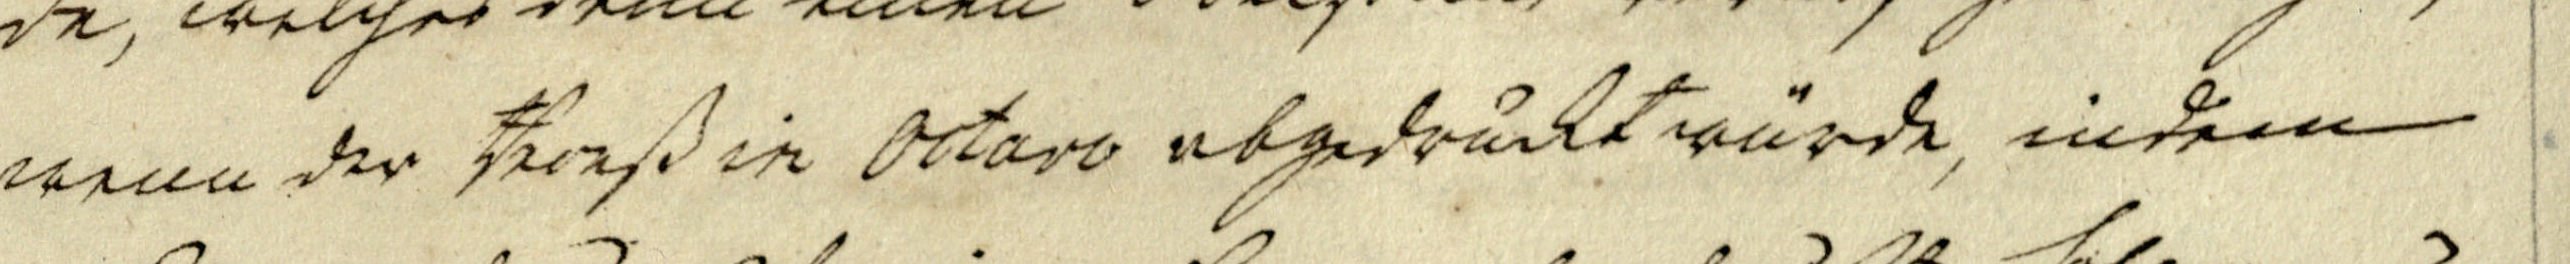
wenn der Receß in Octavo abgedruckt würde, indem
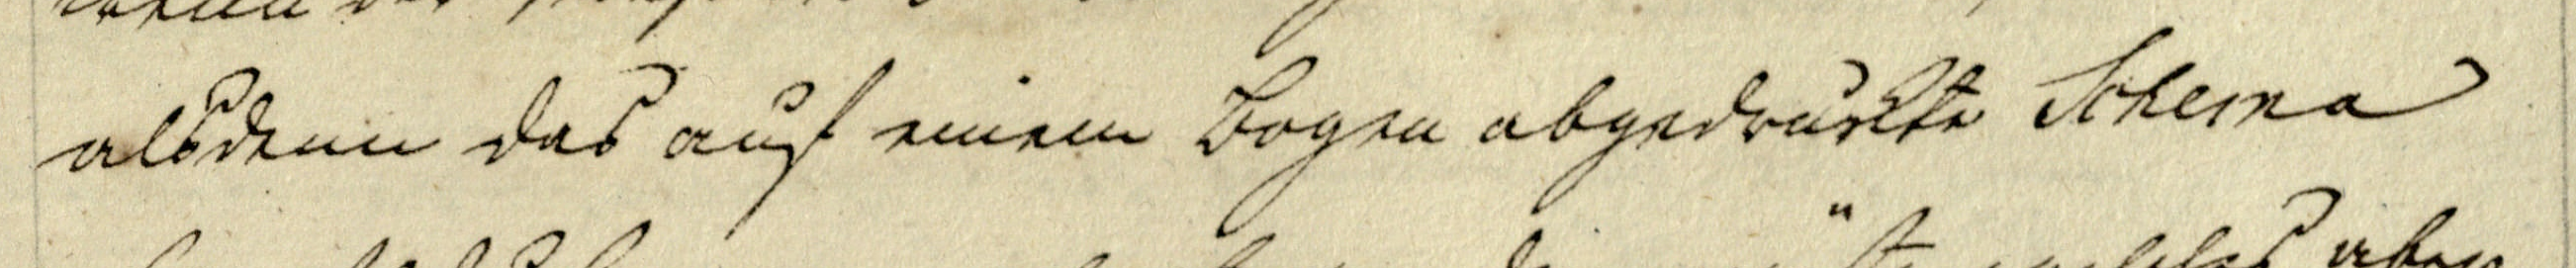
alsdenn das auf einem Bogen abgedruckte Schema
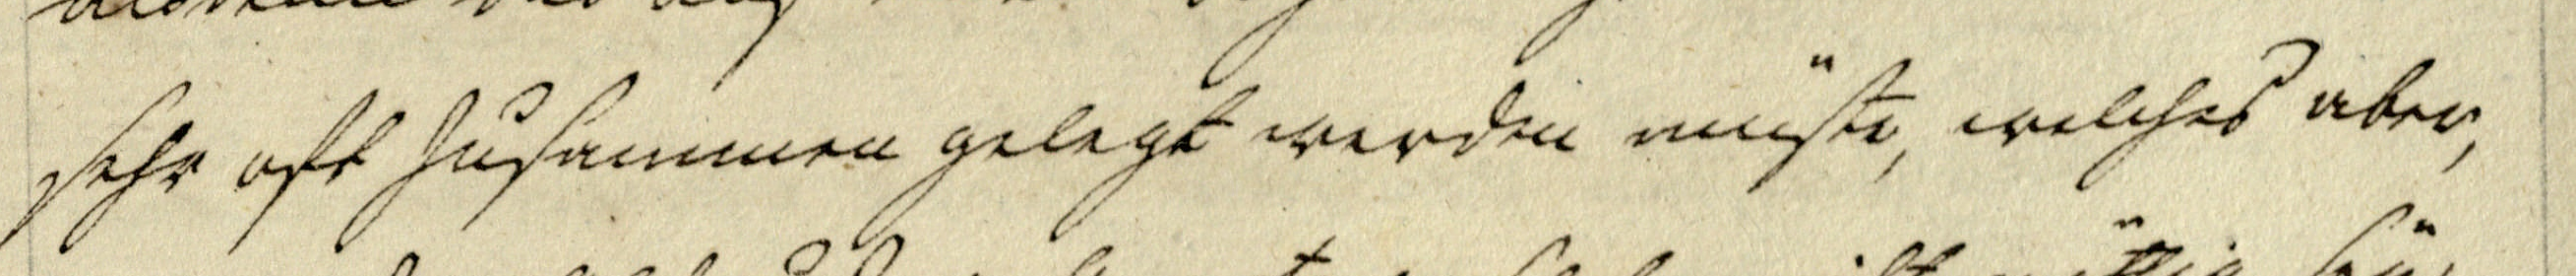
sehr oft zusammen gelegt werden müßte, welches aber,
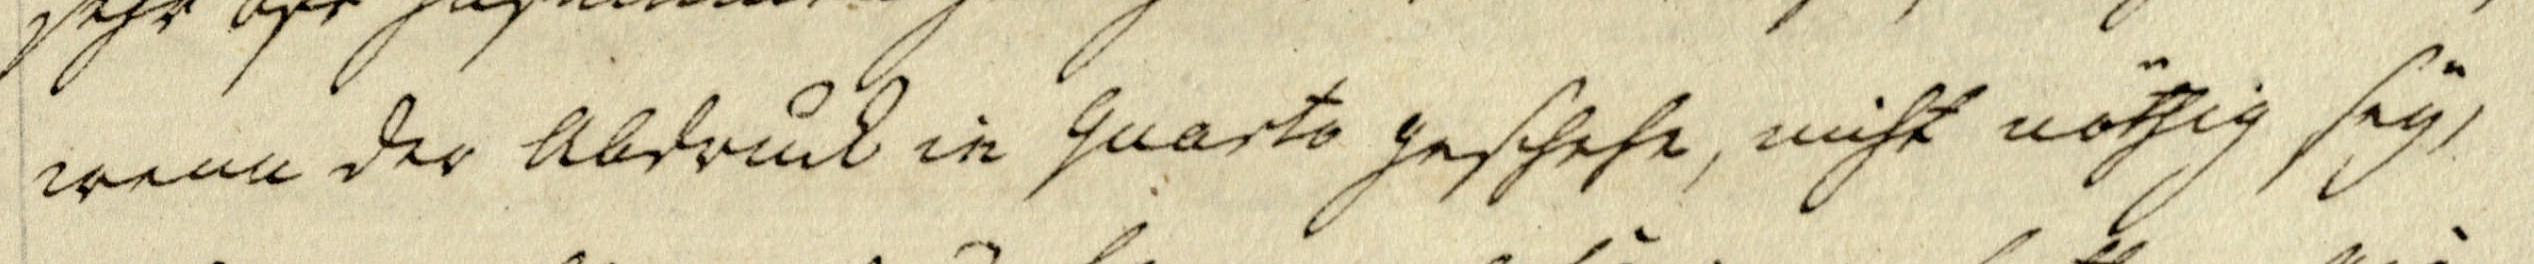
wenn der Abdruck in Quarto geschehe, nicht nöthig seÿ,
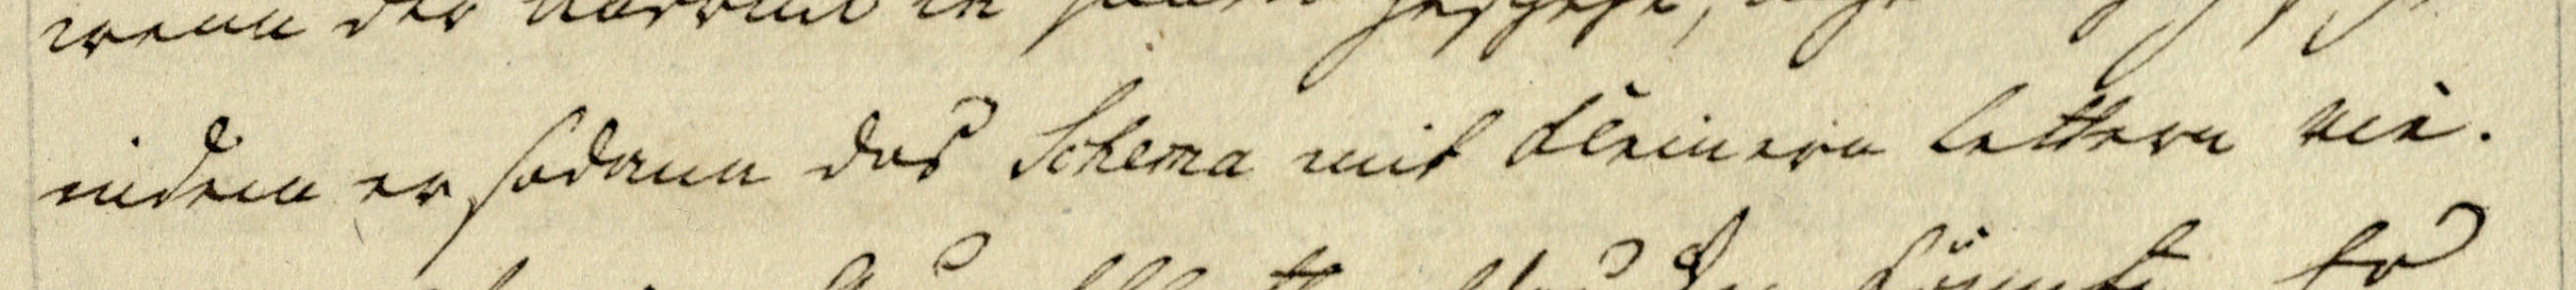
indem er sodann das Schema mit kleinern Lettern vie¬
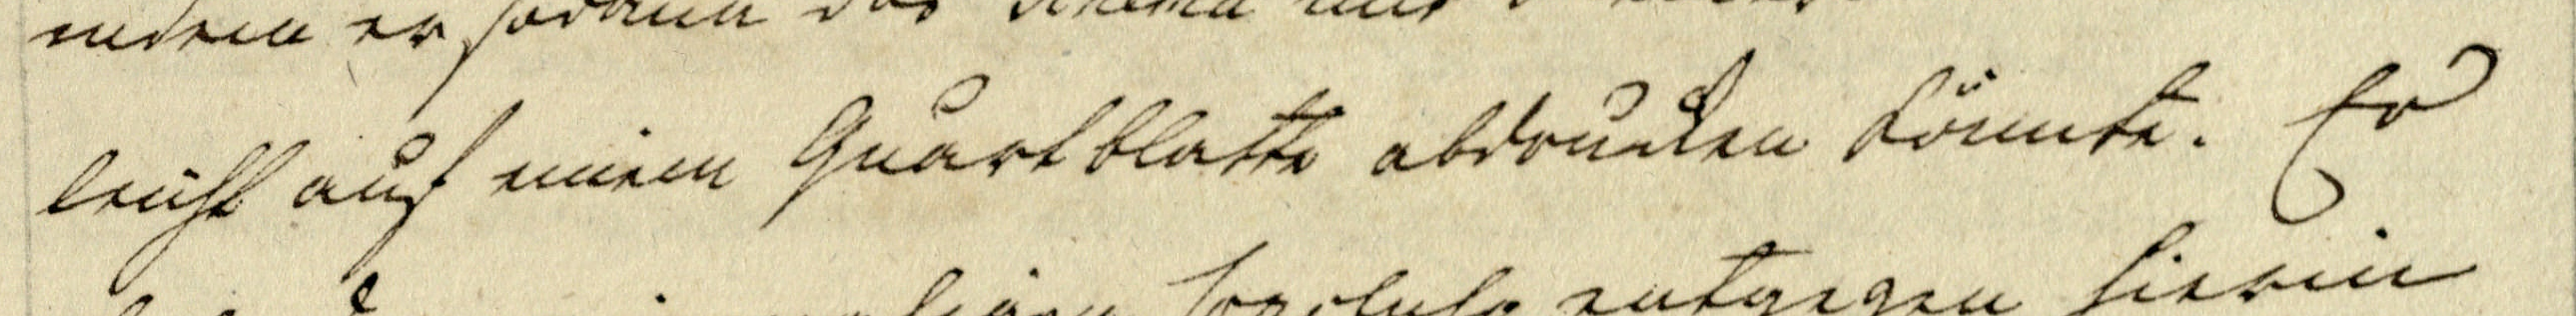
leicht auf einem Quartblatte abdrucken könnte. Er
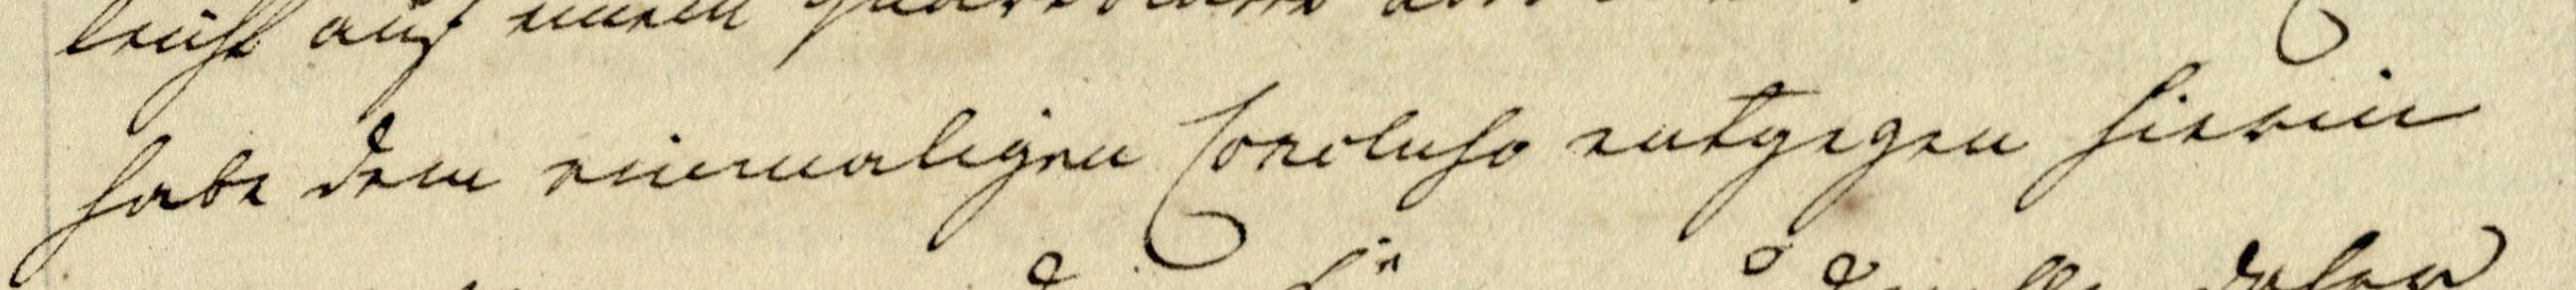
habe dem einmaligen Concluso entgegen hierin
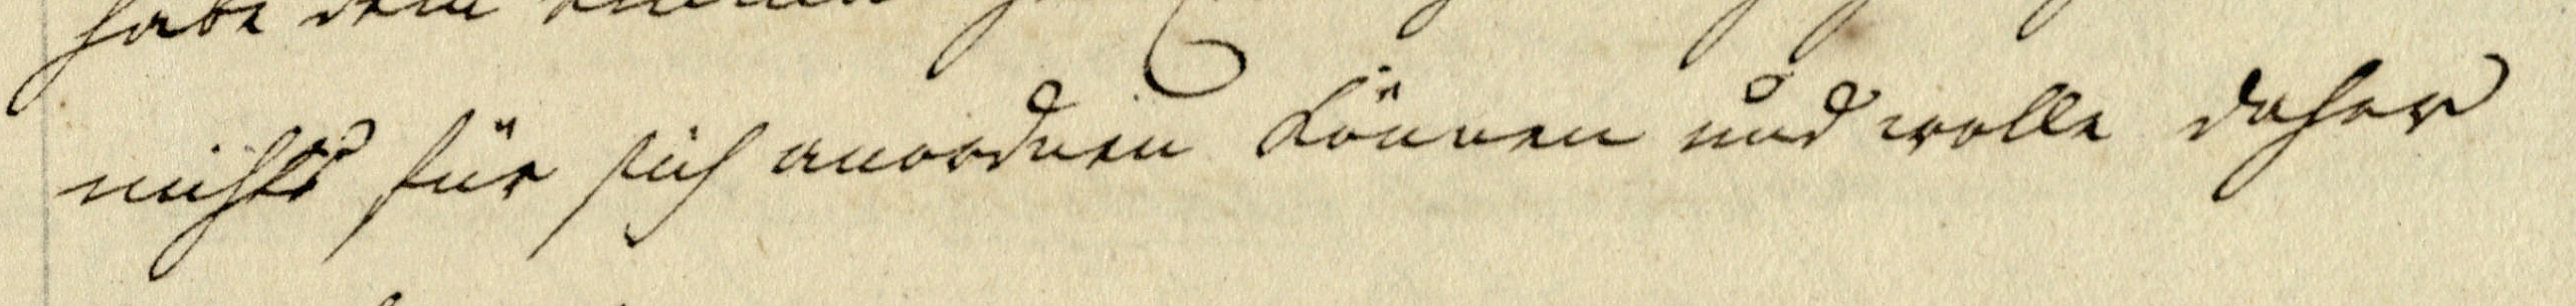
nichts für sich anordnen können und wolle daher
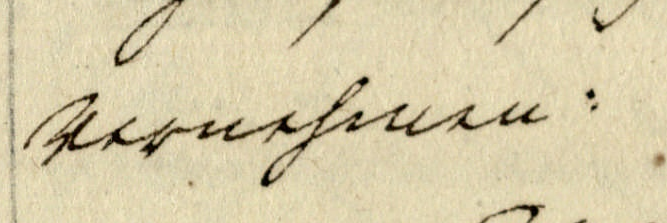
vernehmen:
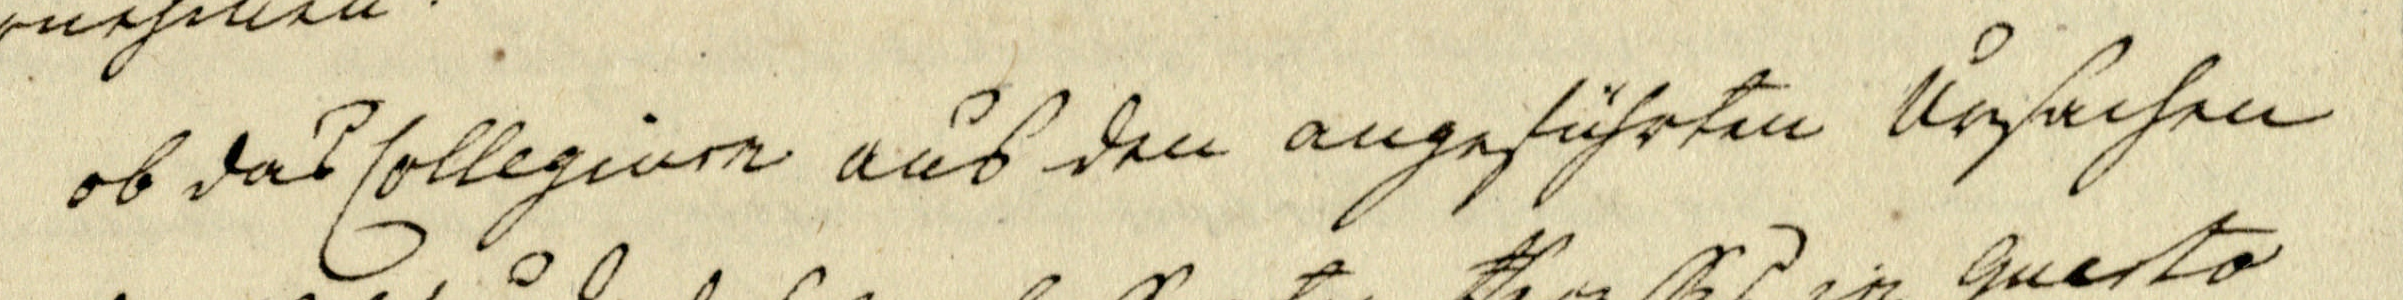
ob das Collegium aus den angeführten Ursachen
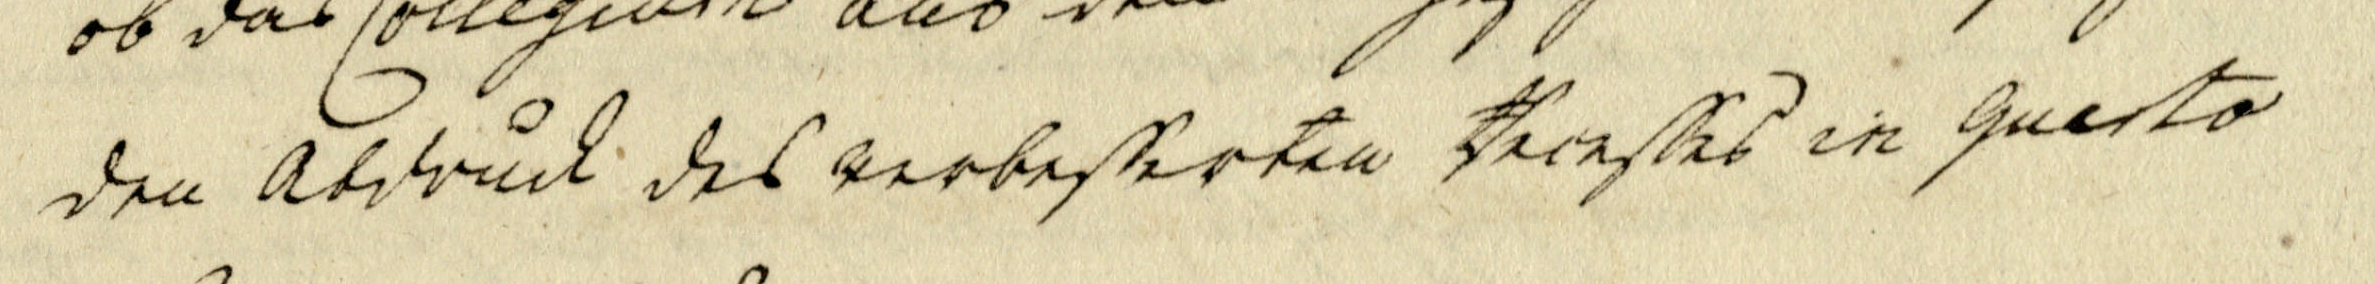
den Abdruck des verbesserten Recesses in Quarto
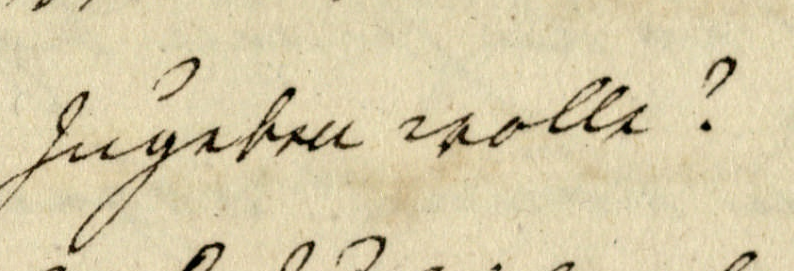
zugeben wolle?
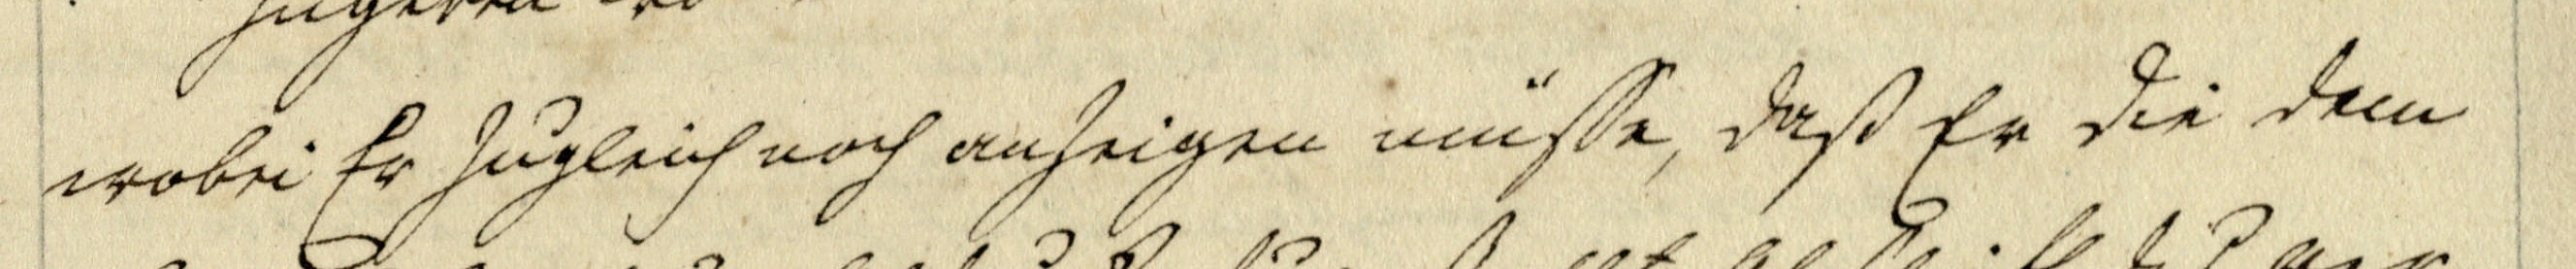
wobei Er zugleich noch anzeigen müsse, daß Er die dem
